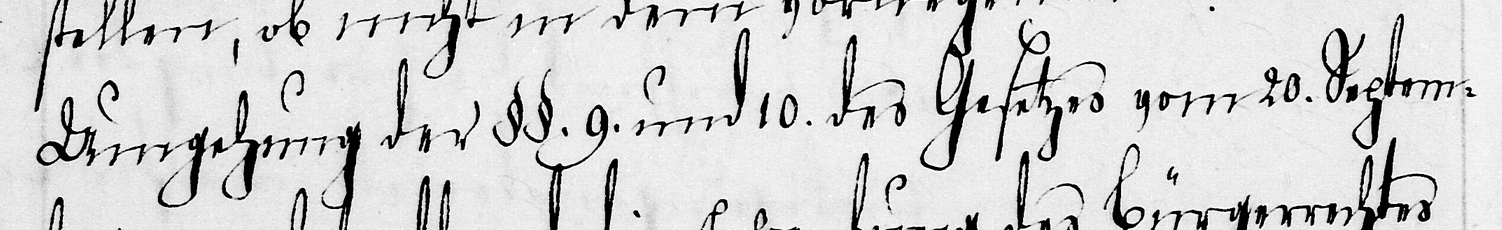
Umgehung der §§. 9. und 10. des Gesetzes vom 20. Septem¬
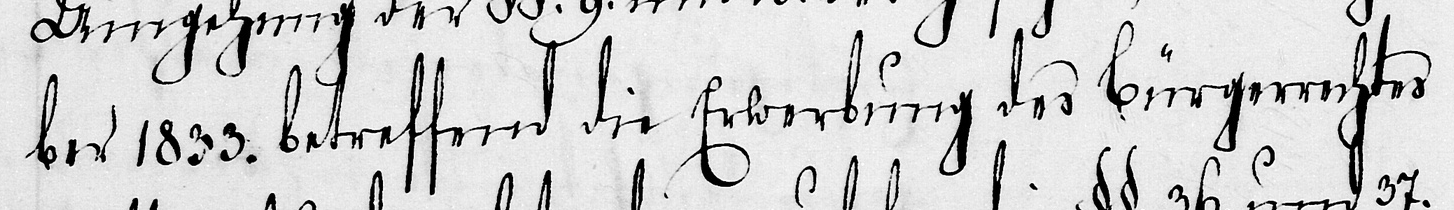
ber 1833. betreffend die Erwerbung des Bürgerrechtes
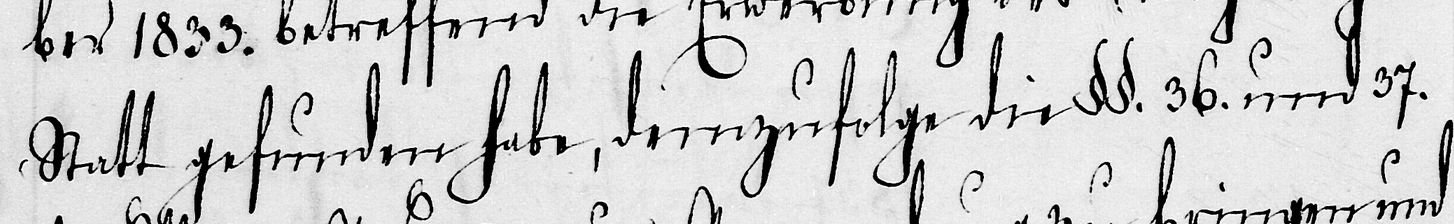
Statt gefunden habe, demzufolge die §§. 36.
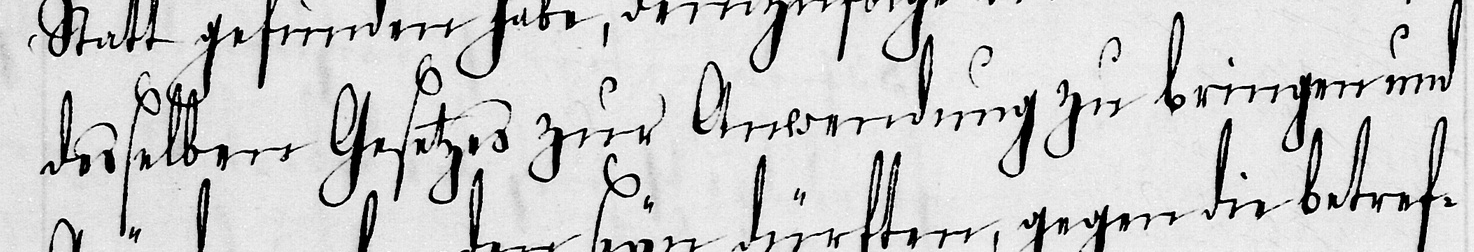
desselben Gesetzes zur Anwendung zu bringen und
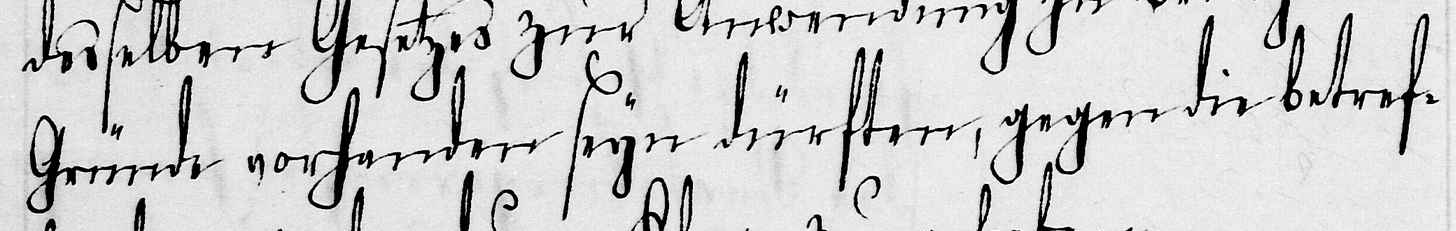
Gründe vorhanden seyn dürften, gegen die betref¬
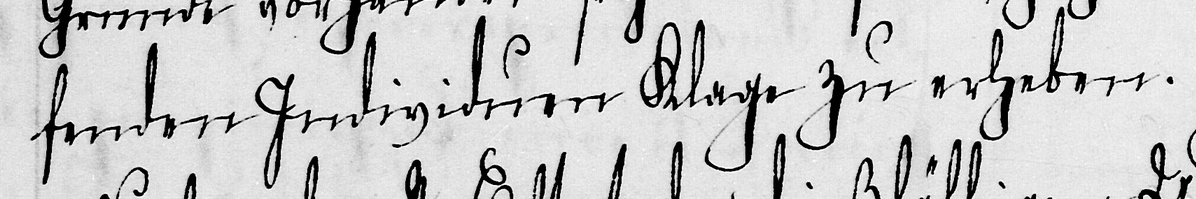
fenden Individuen Klage zu erheben.
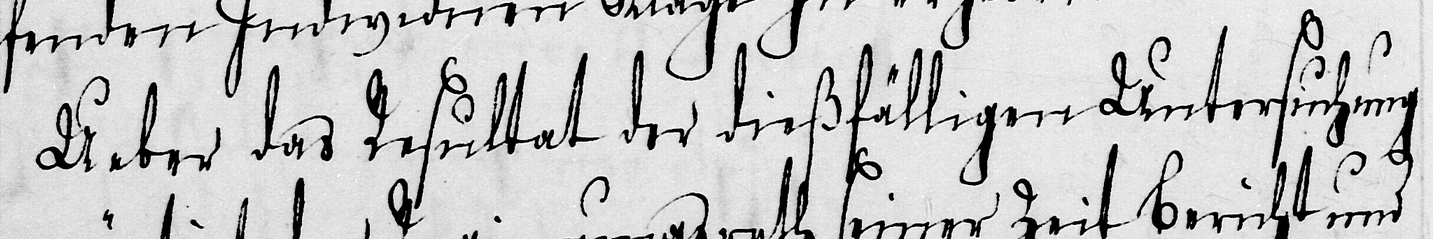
Ueber das Resultat der dießfälligen Untersuchung
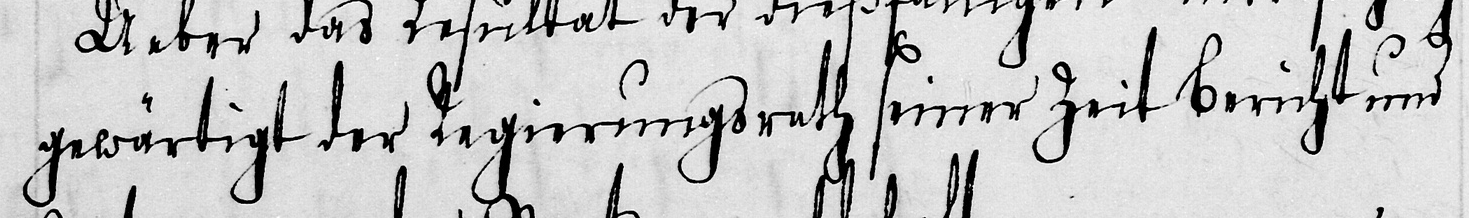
gewärtigt der Regierungsrath seiner Zeit Bericht und
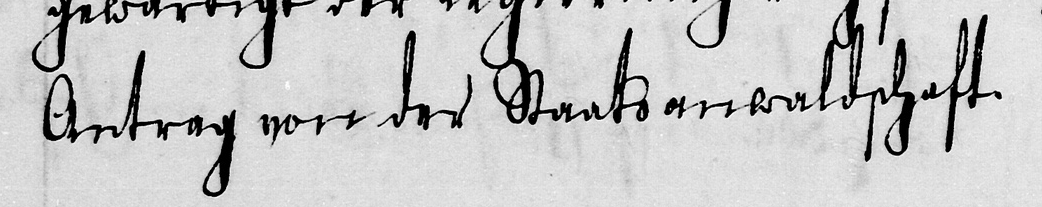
Antrag von der Staatsanwaldschaft.
